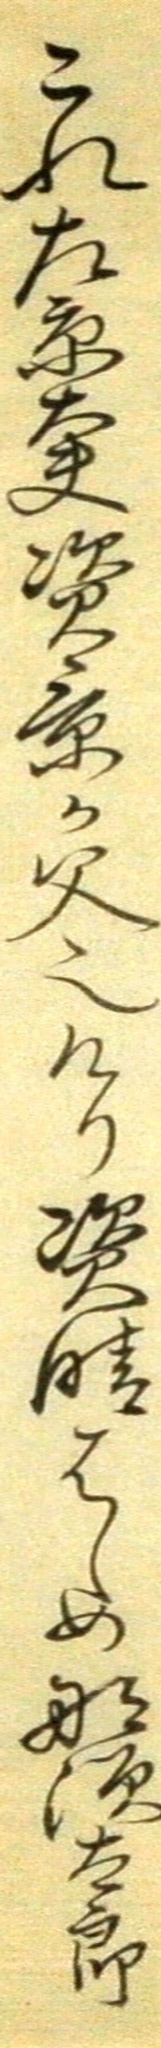これ左京大夫資景か父也けり資晴はしめ那須太郎
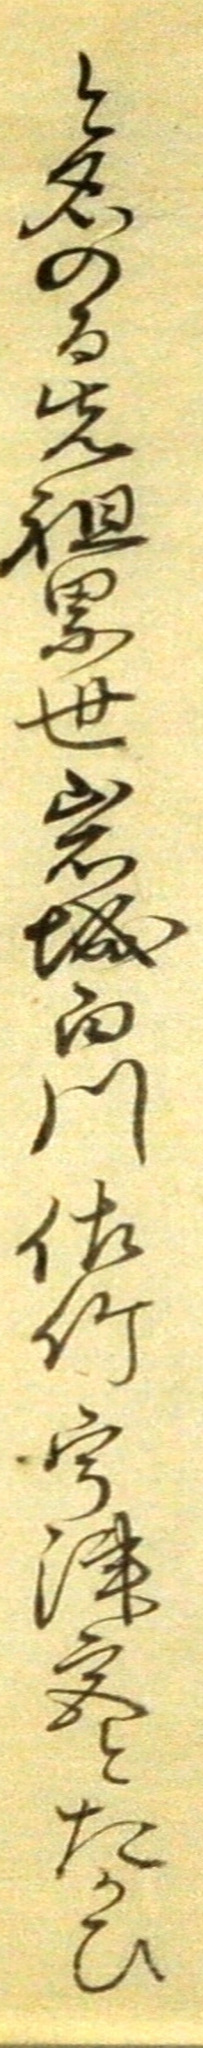と名のる先祖累世岩城白川佐竹宇津宮とたかひ
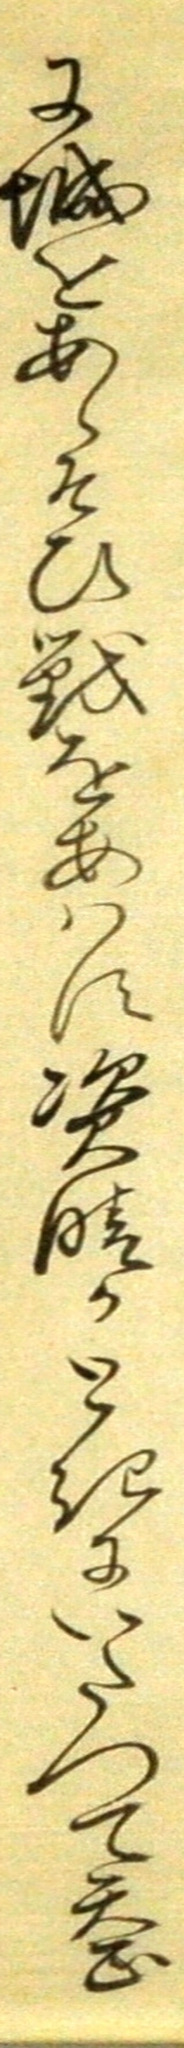に城をあらそひ戦をあはす資晴かときにいたつて天正
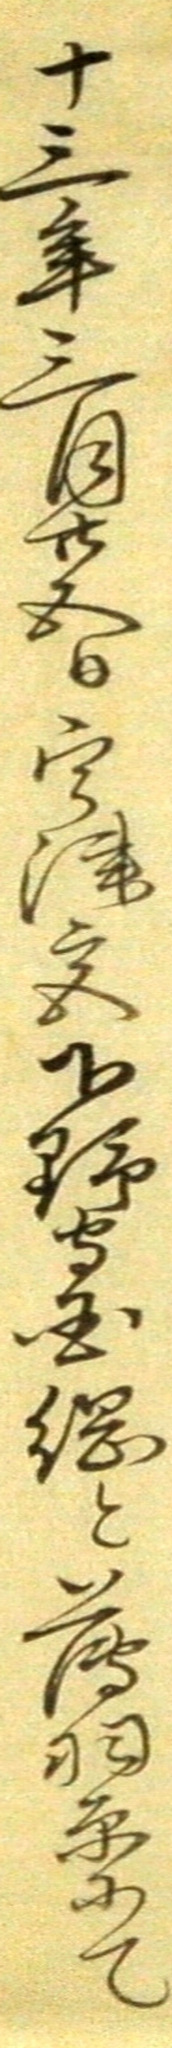十三年三月廿五日宇津宮下野守国綱と薄羽原にて
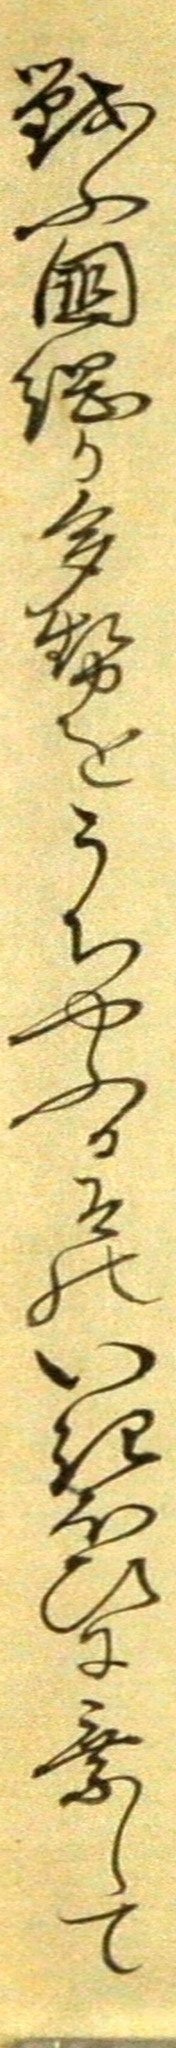戦ふ国綱か多勢をうちやふるそのいきほひに乗して

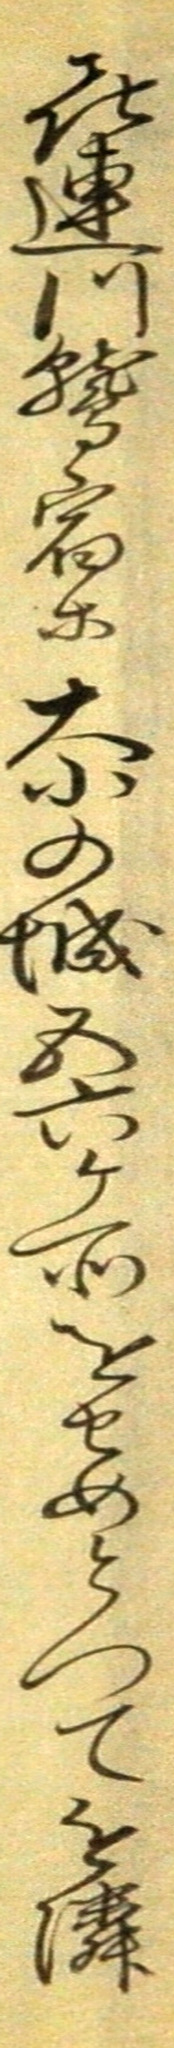喜連川鷲宿等大小の城五六ヶ所をせめとつて近隣
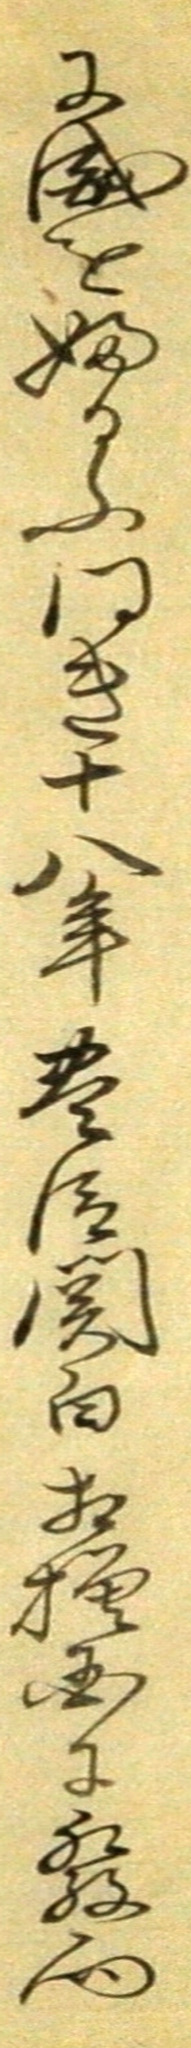に威をふるふ同き十八年豊臣関白相模国に発向
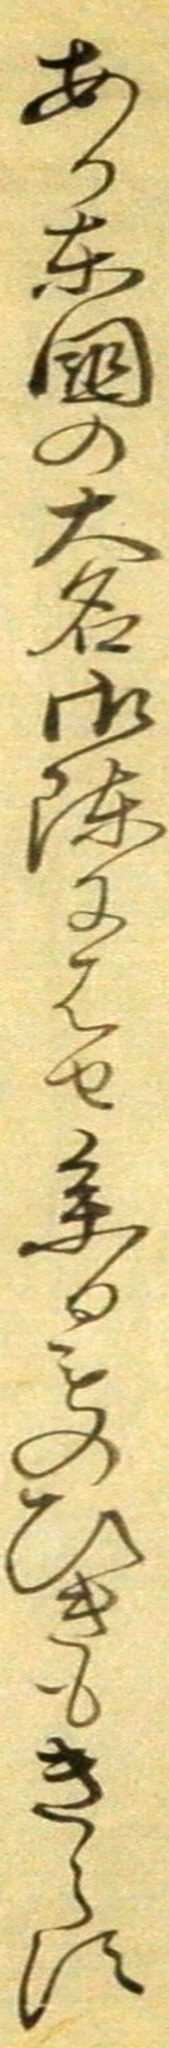あり東国の大名御陣にはせ参るものひきもきらす
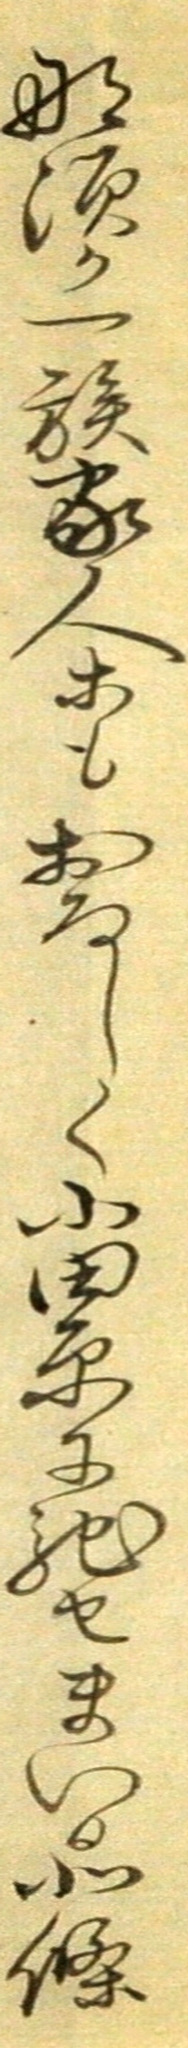那須か一族家人等もおなしく小田原に馳せまいる北条
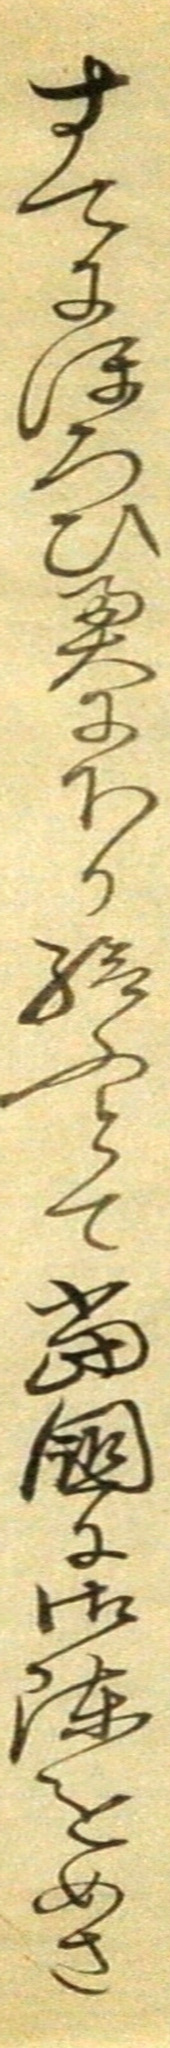すてにほろひ奥に下り給ふとて当国に御陣をめさ
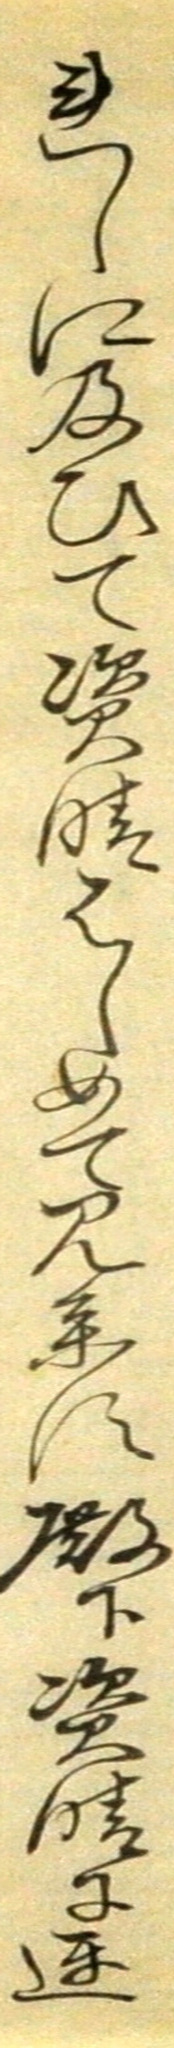れしに及ひて資晴はしめて見参す殿下資晴に遅
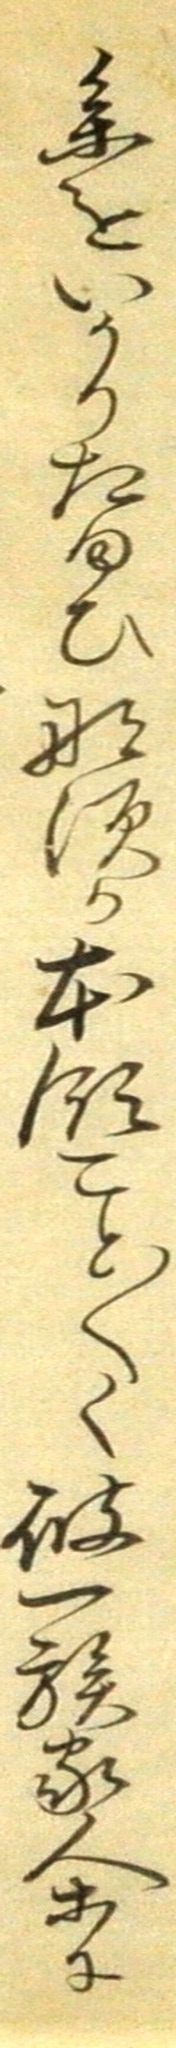参をいかりたまひ那須か本領こと〳〵く彼一族家人等に
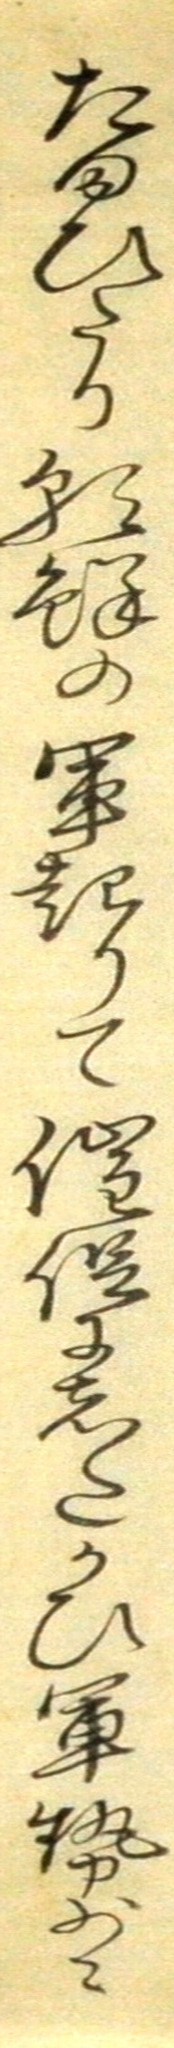たまひたり朝鮮の軍起りて催促にしたかひ軍勢少々
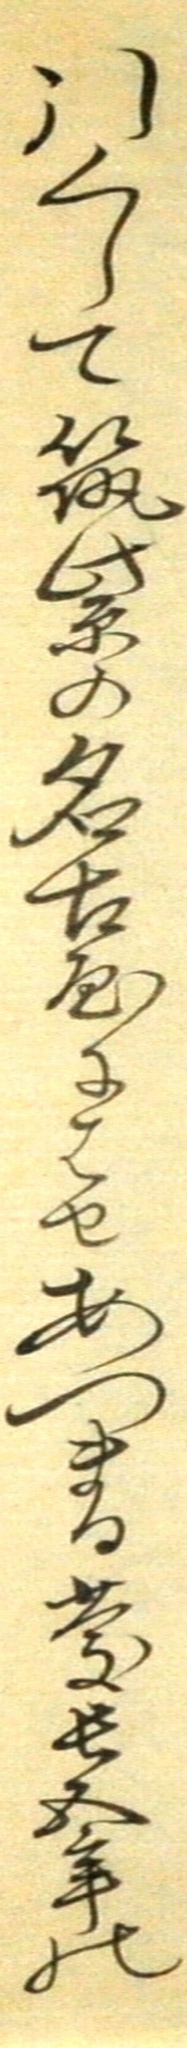引くして筑紫の名古屋にはせあつまる慶長五年の
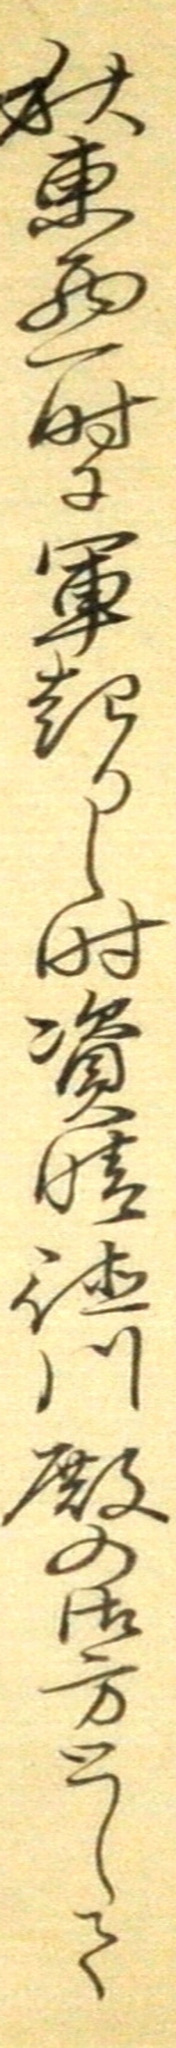秋東西一時に軍起りし時資晴徳川殿の御方として
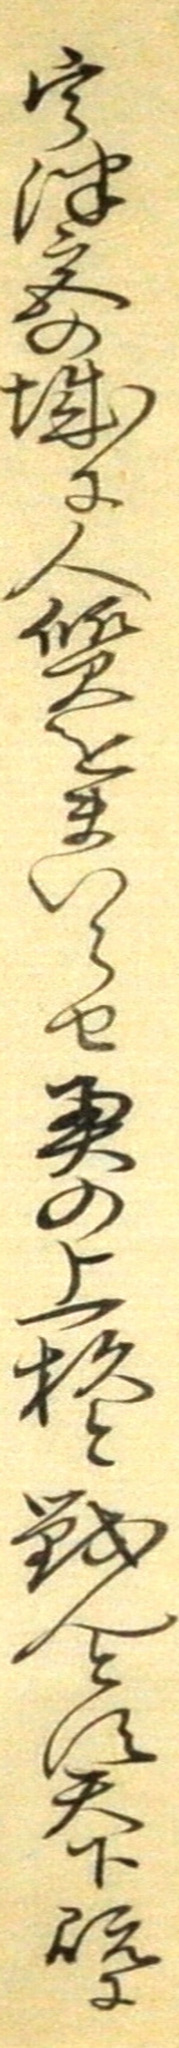宇津宮の城に人質をまいらせ奥の上杉と戦んとす天下既に
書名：藩翰譜（九・下）
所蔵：伊那市立高遠町図書館・合同会社AMANE
